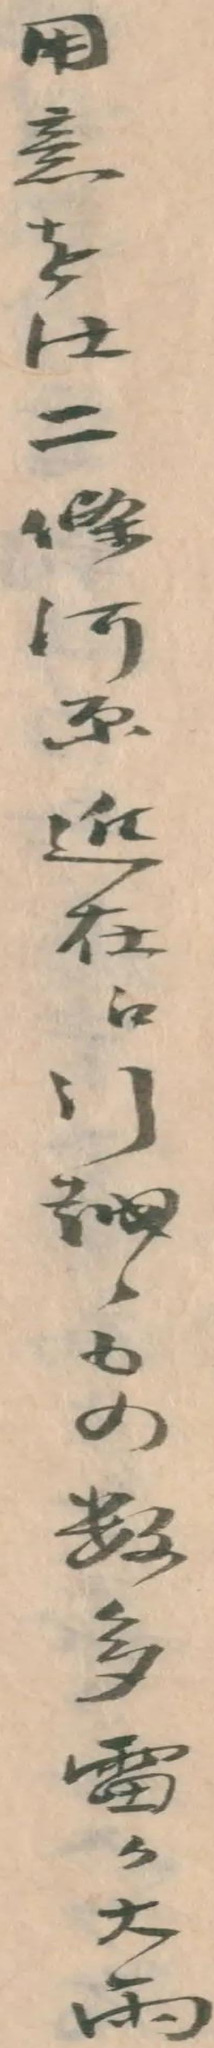用意を仕二條河原近在江引越候もの数多雷か大雨
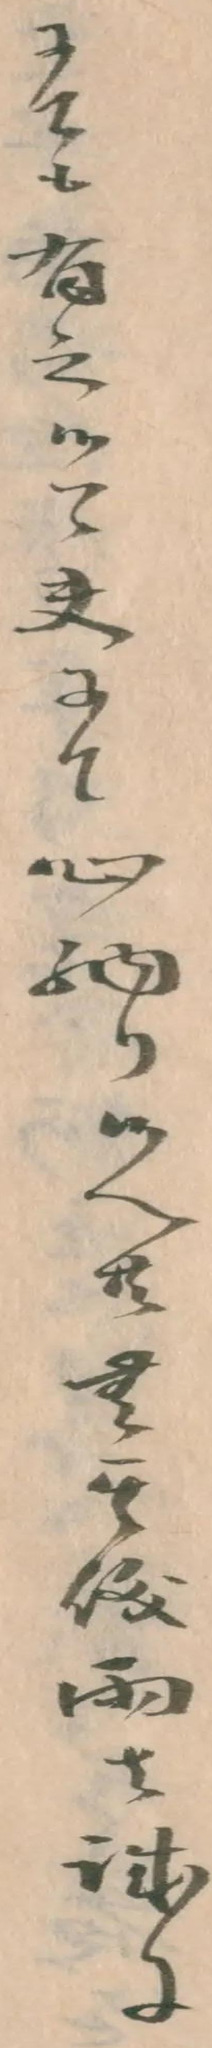にても有之候て夫にて心納り候へ共其後雨者誠に
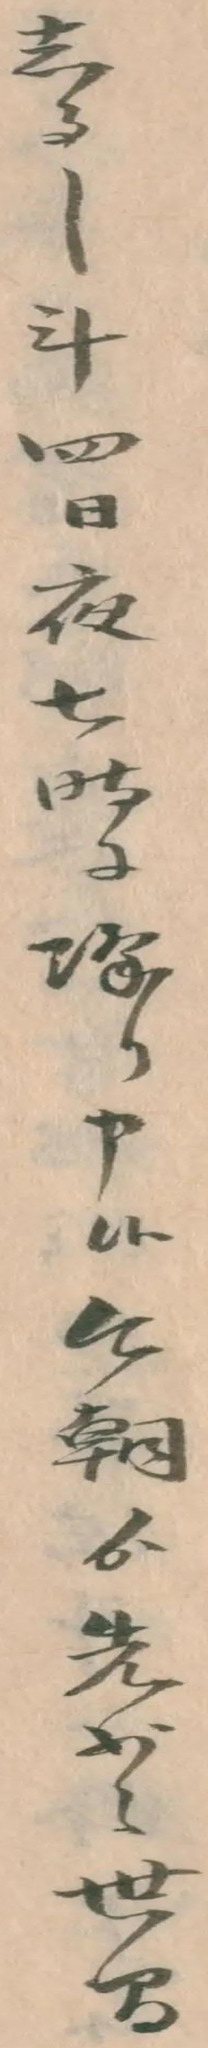しるし斗四日夜七時に降り申候今朝ゟ先少し世間
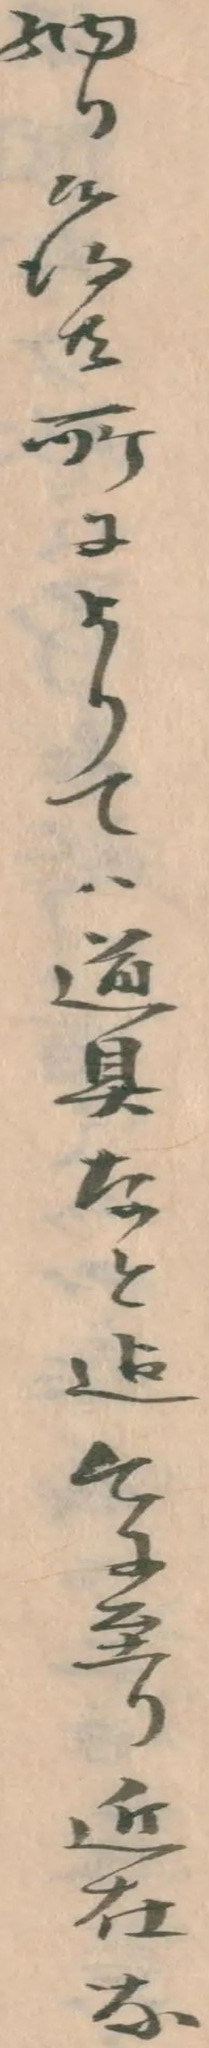納り候得共所によりてハ道具なと迄今に至り近在な
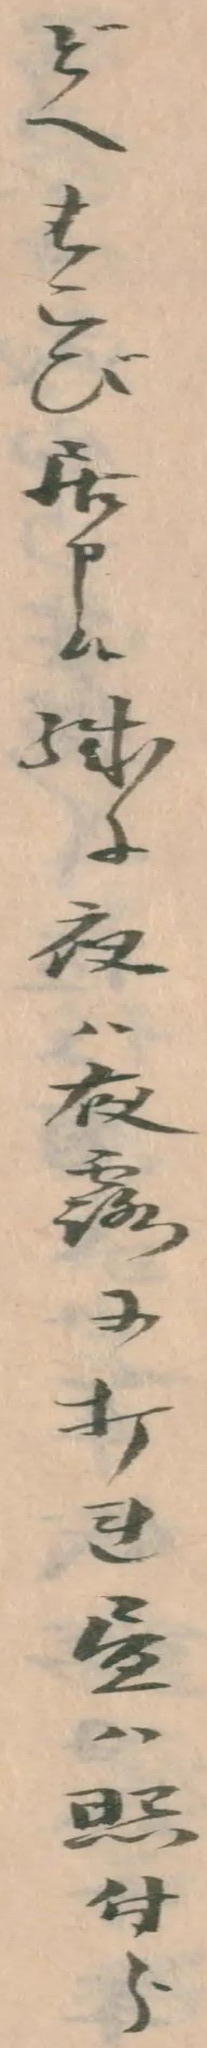どへはこび居申候誠に夜ハ夜露に打れ昼ハ照付ら
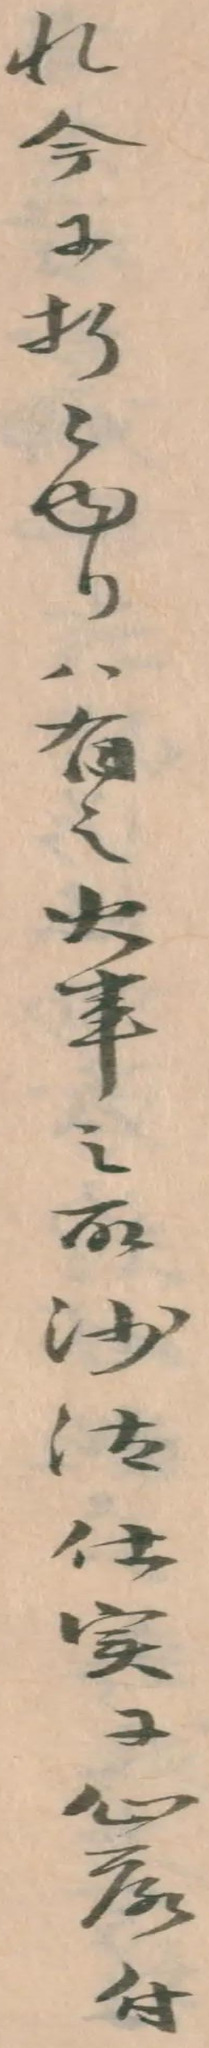れ今に折々ゆりハ有之カ火事之所沙汰仕実に心落付
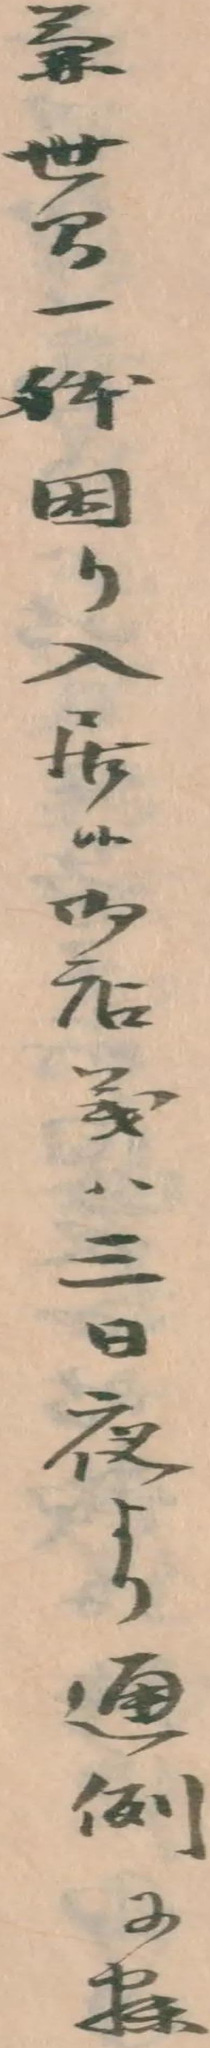兼世間一体困り入居候御店義ハ三日夜より通例に寝
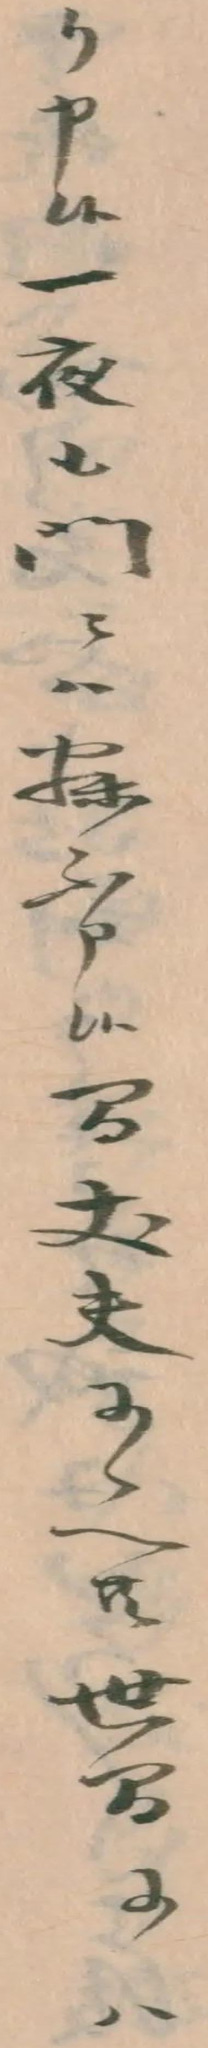り申候一夜も門二ハ寝不申候間丈夫に候へ共世間にハ
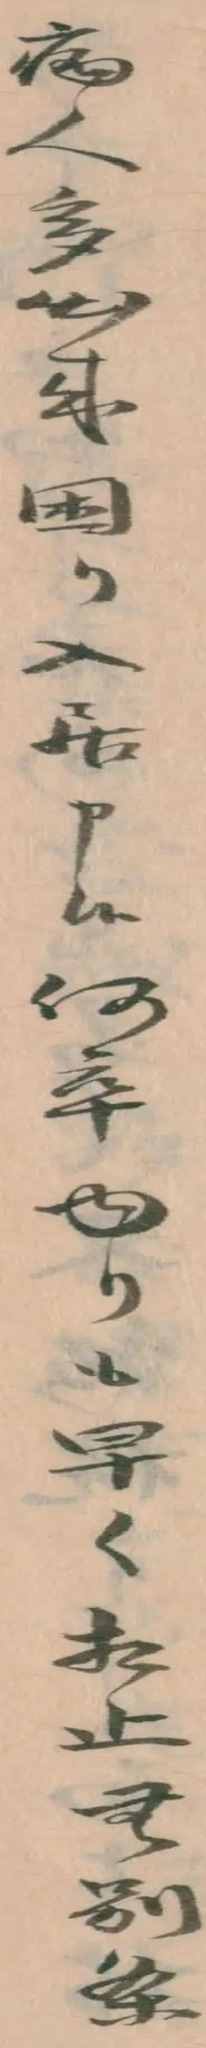病人多出来困り入居申候何卒ゆりも早く相止無別条
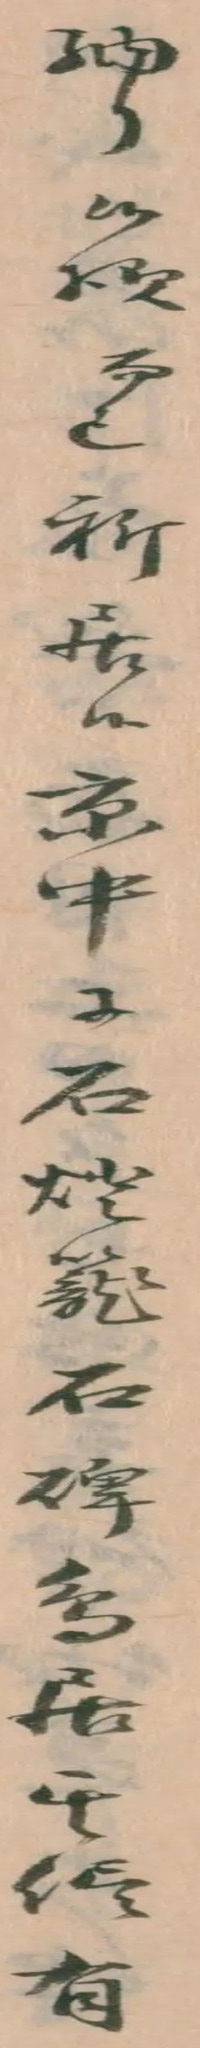納り候様而己祈居候京中に石燈籠石砕鳥居其侭有
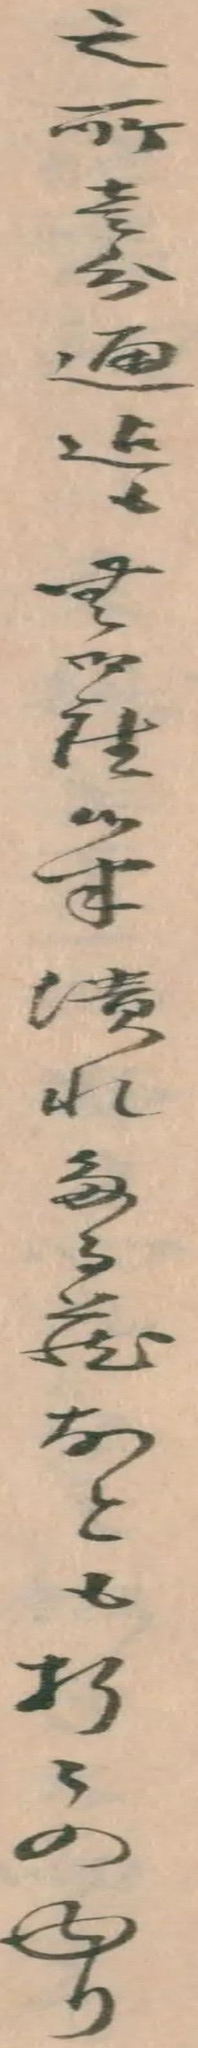之所壱分通迄も無御座候半潰たる蔵なとも折々のゆり
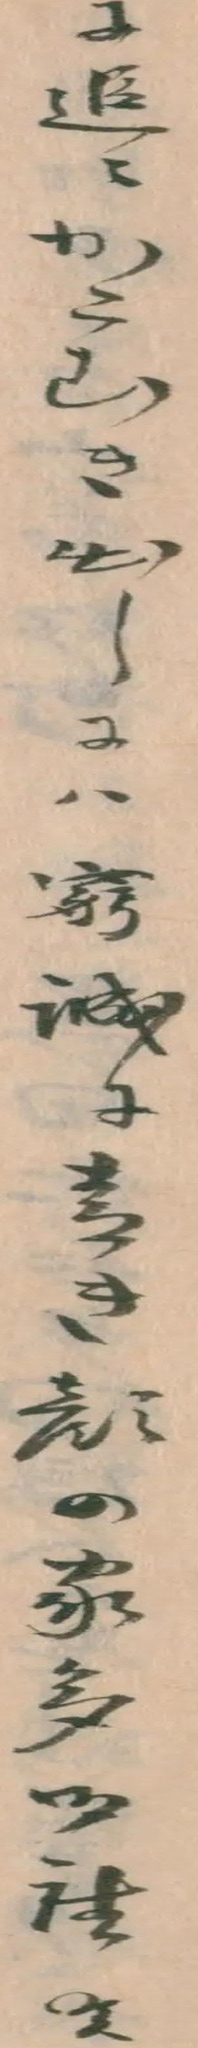に追々かたむき出しにハ窮誠に青き顔の家多御座候
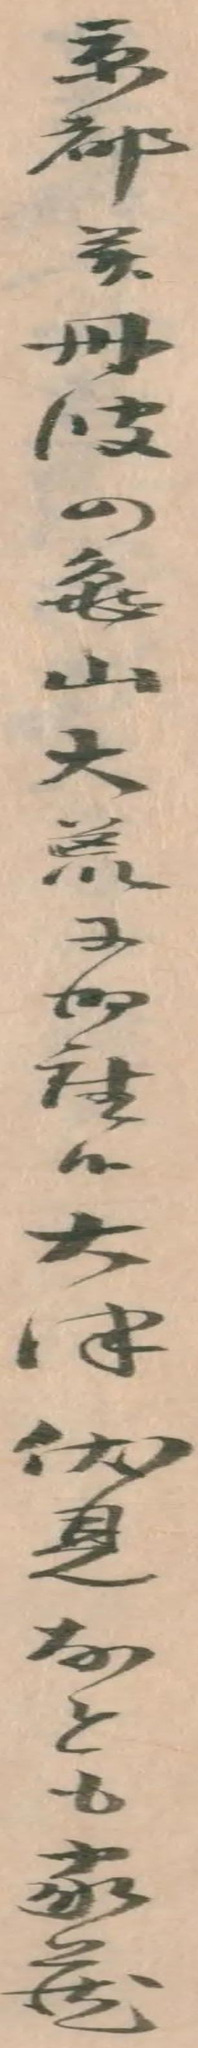京都并丹波の亀山大荒に御座候大津伏見なとも家蔵
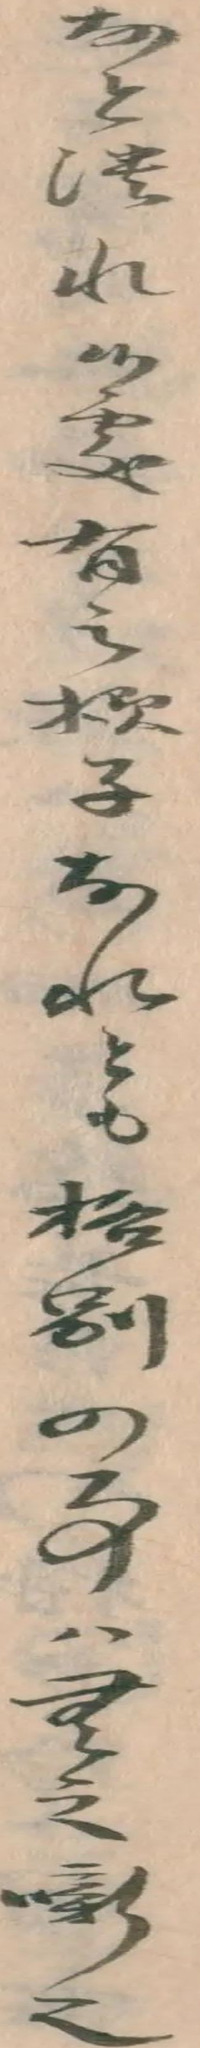なと潰れ候処有之様子なれとも格別の事ハ無之噺也
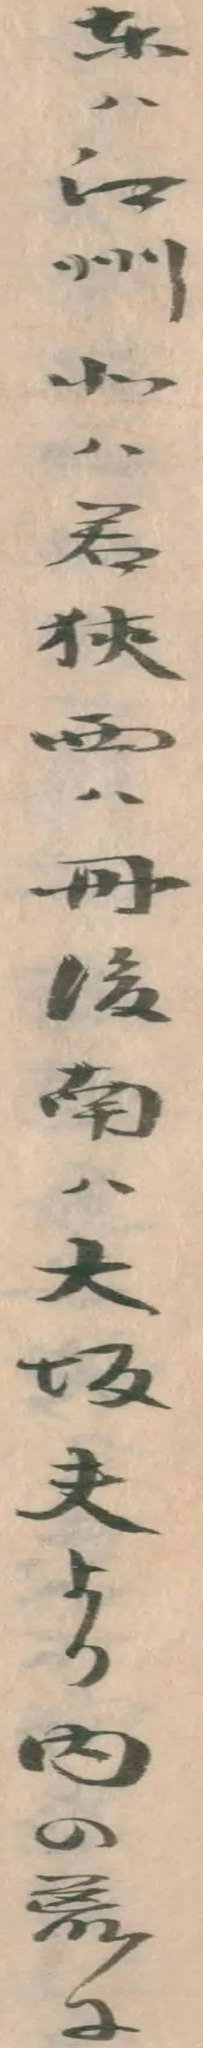東ハ江州北ハ若狭西ハ丹後南ハ大坂夫より内の荒に
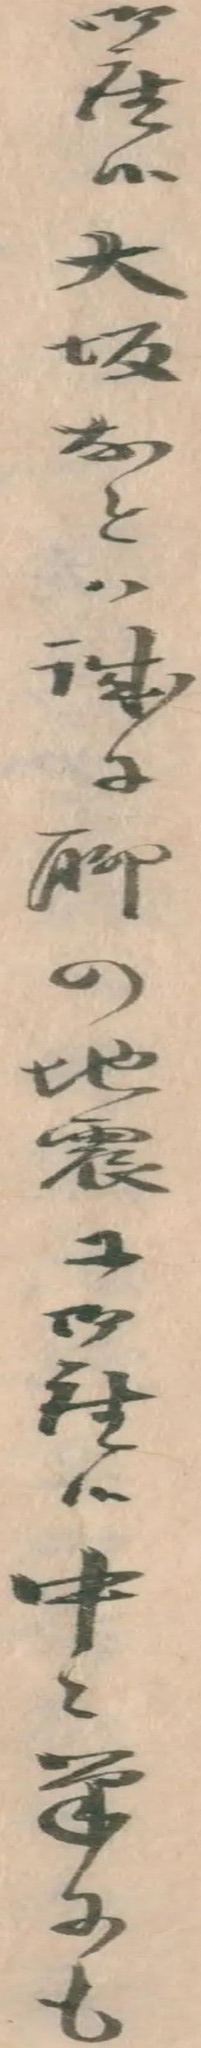御座候大坂なとハ誠に聊の地震に御座候中々筆にも
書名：京都地震
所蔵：国立国会図書館 National Diet Library, JAPAN
